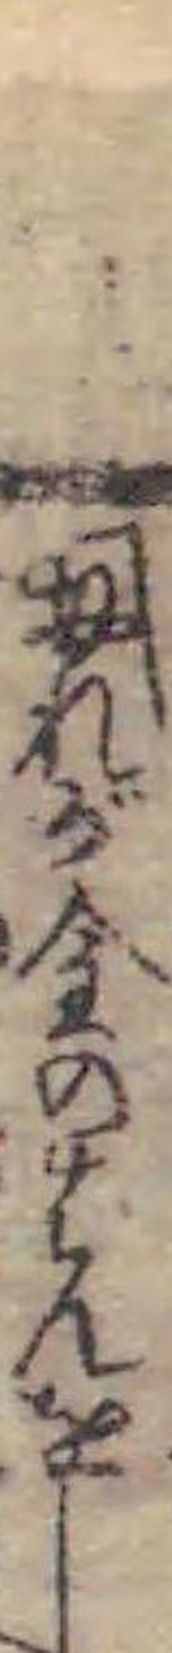〽おれが金のはんを
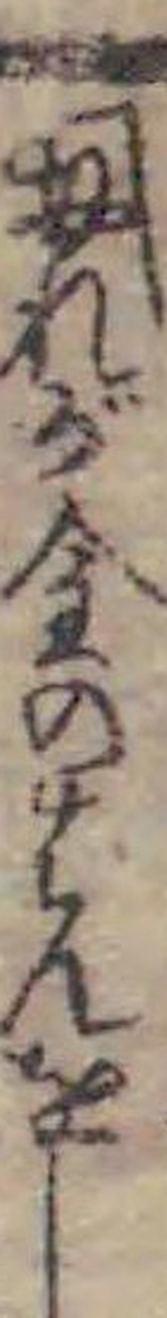〽おれが金のはんを
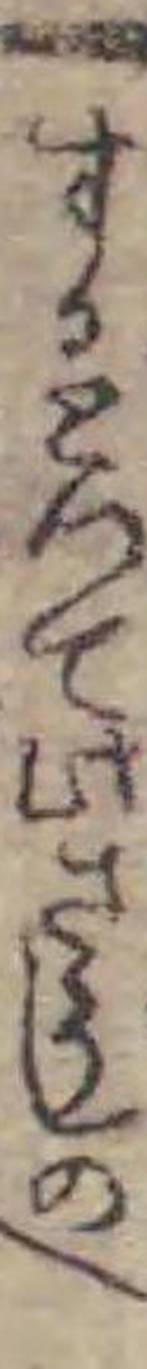するとつて此さうしの
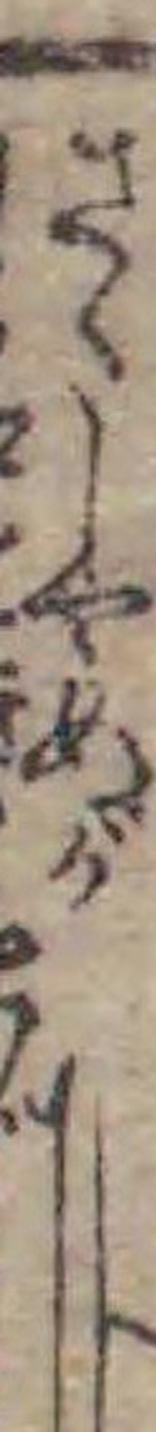さくしやめが
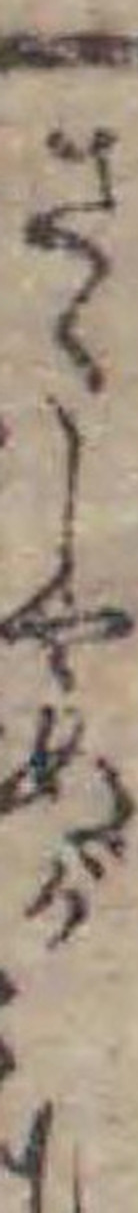さくしやめが
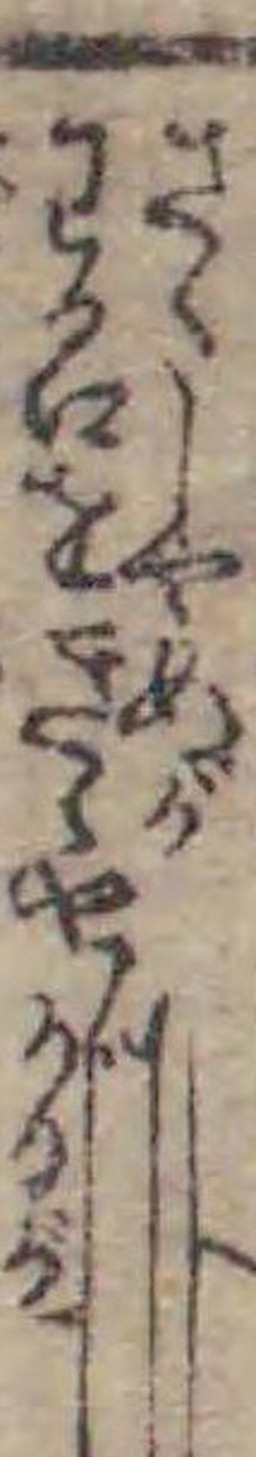わる口をきゝやがるが
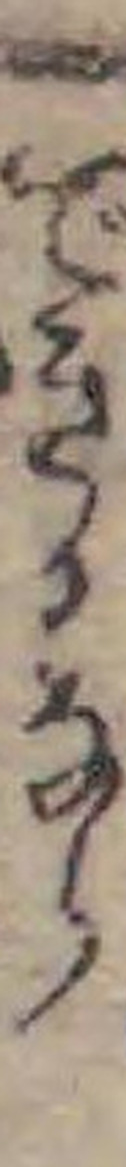できるなら
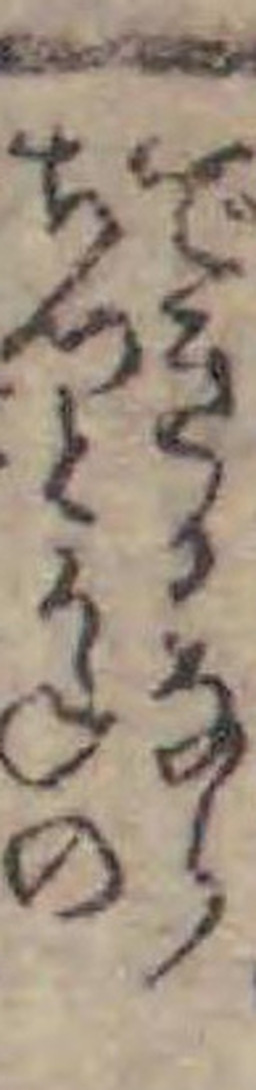ちつとかねの
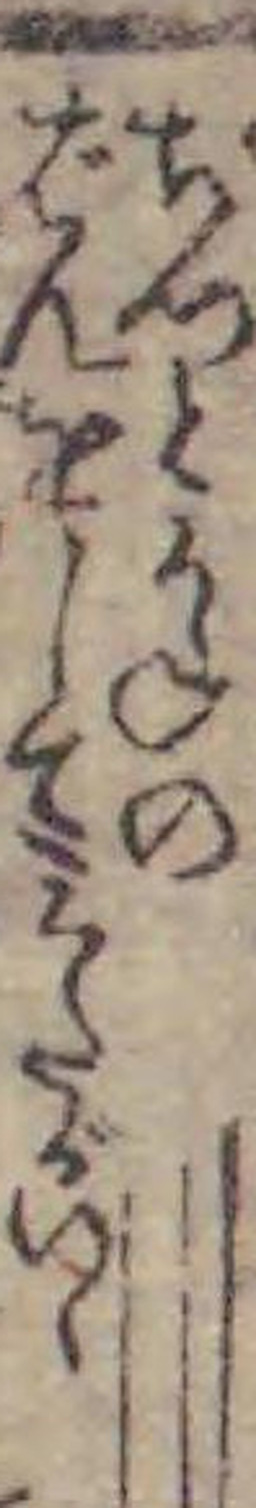ばんをしてみたがいゝ
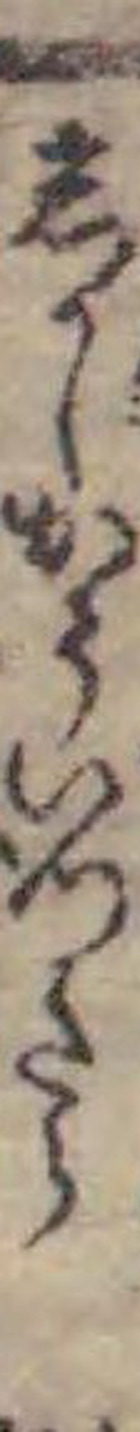しかしかういつたら
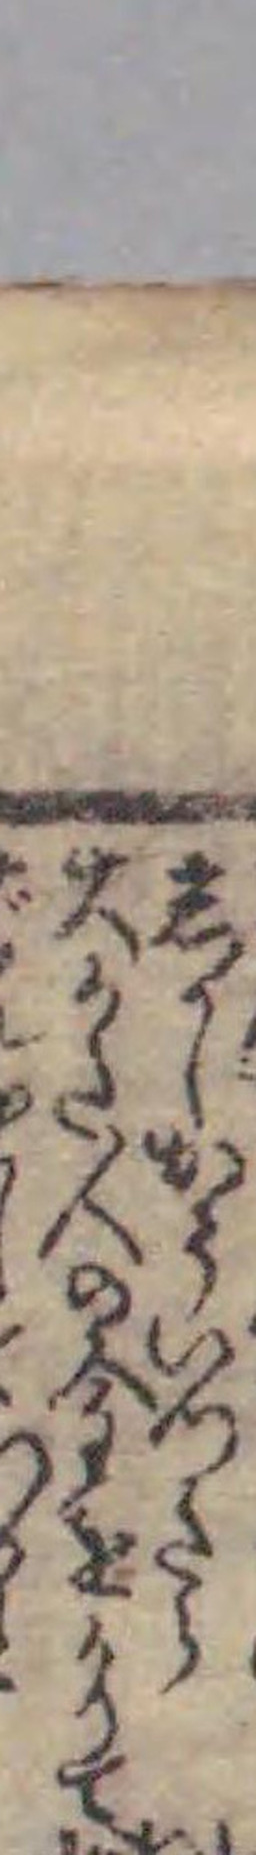大かた人の金をかりて
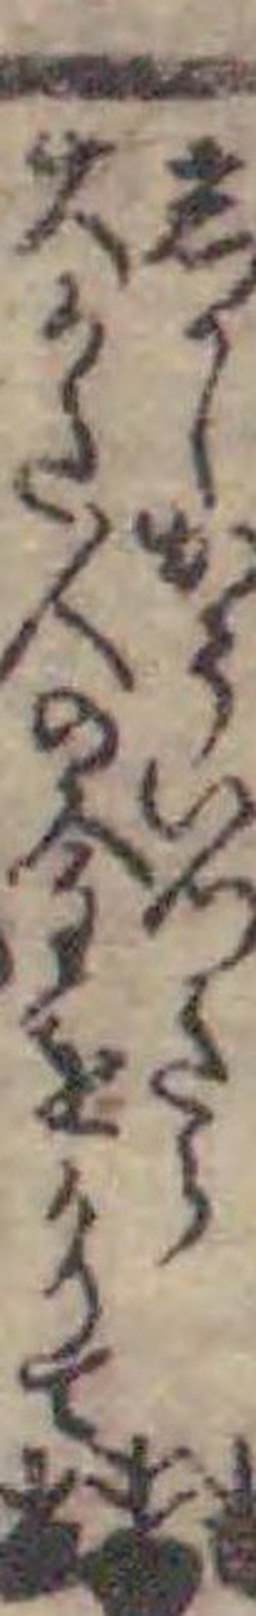大かた人の金をかりて
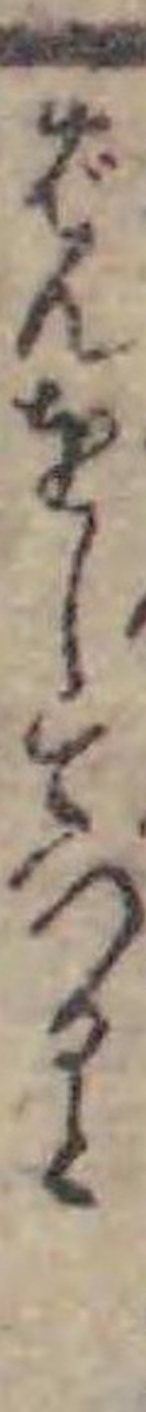ばんをしていると
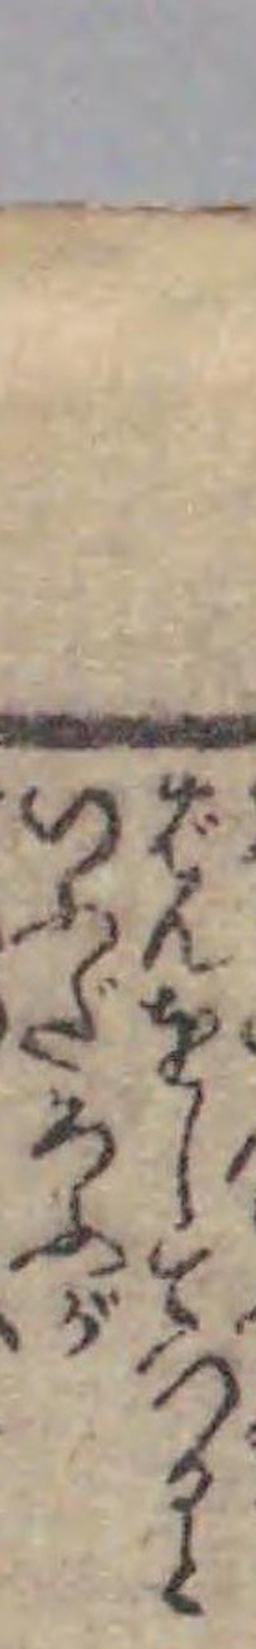いふだろふが
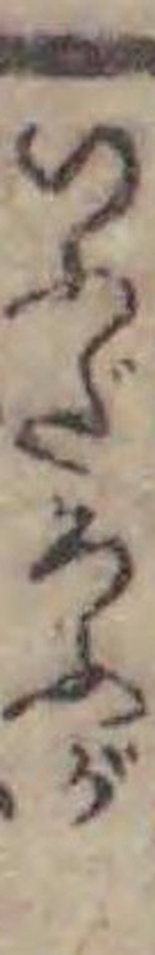いふだろふが
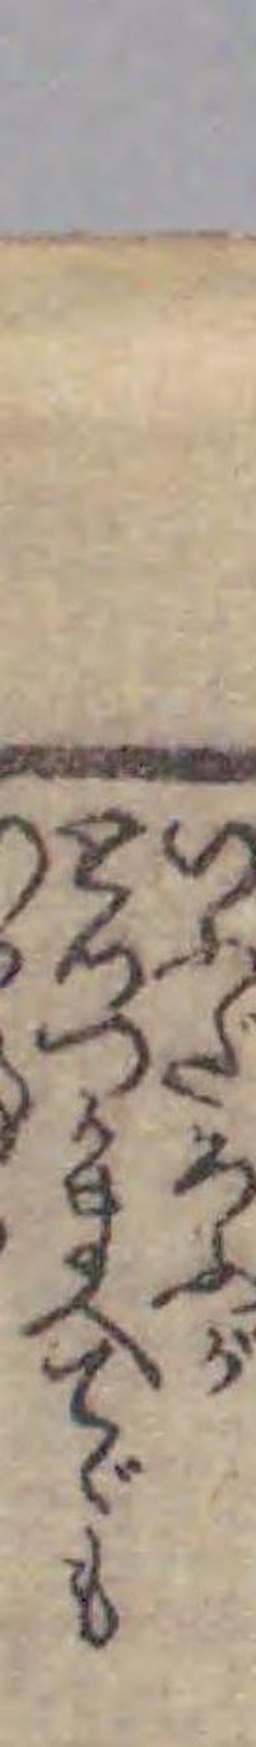とつつかまへてゞも
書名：新鋳小判 : 3巻
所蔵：国立国会図書館 National Diet Library, JAPAN
